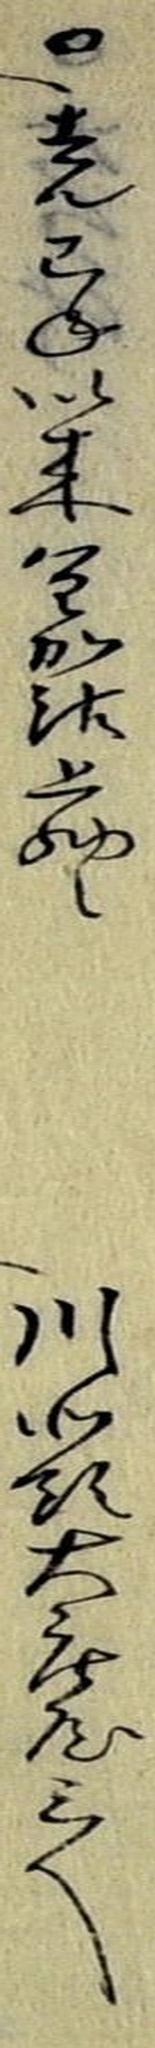○去ル巳年以来冥加銀上納之川北領大庄屋三人
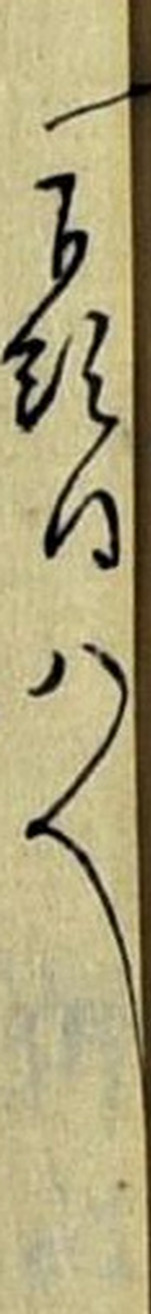下両同八人
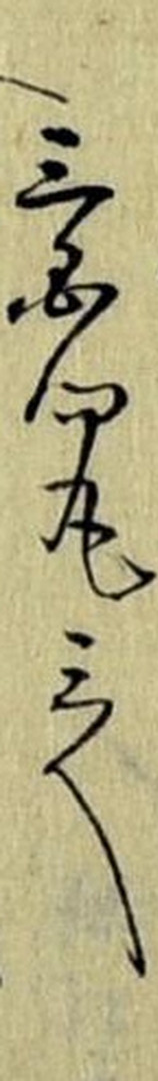三国問丸三人
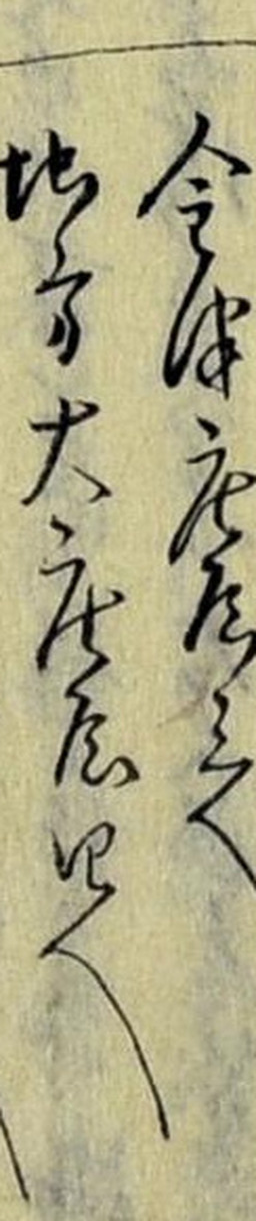地方大庄屋四人
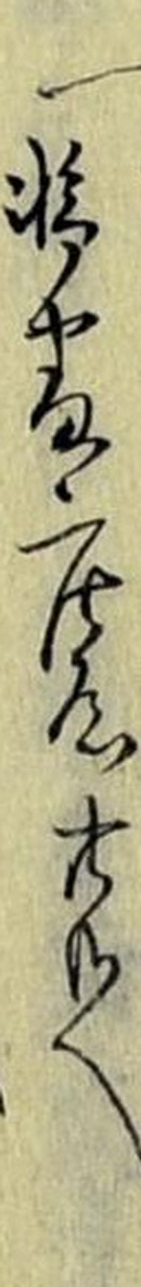輪番庄屋廿弐人
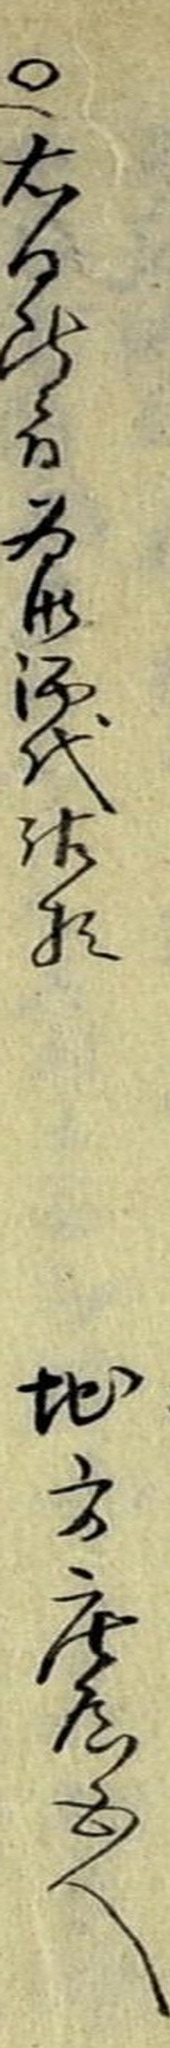○右同断に付為御酒代銀拾地方庄屋五人
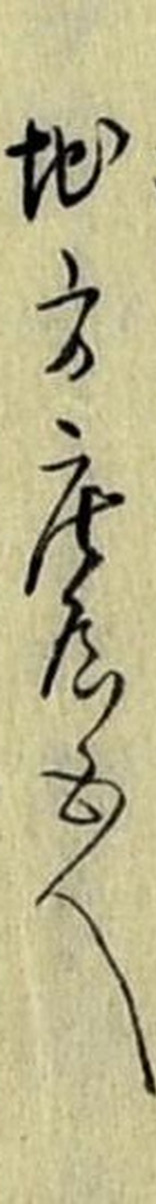地方大庄屋四人
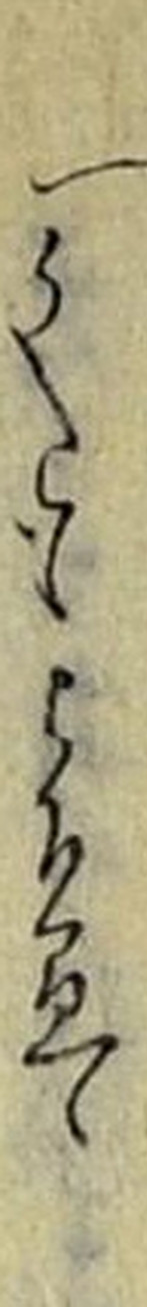匁つヽ被下置候
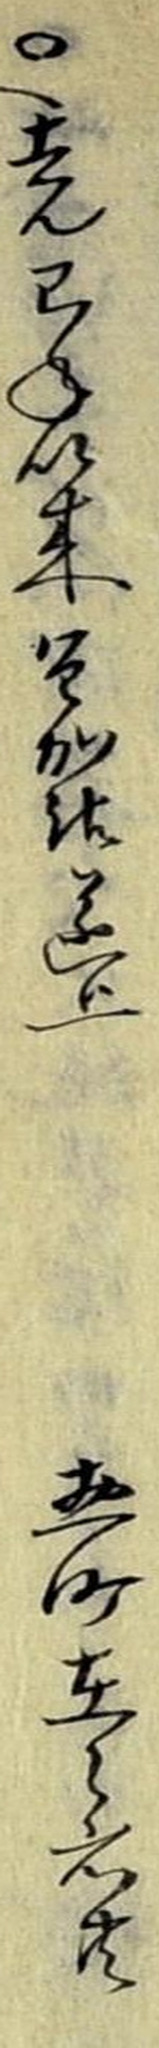○去巳年以来冥加銀遂上惣町在々之者共
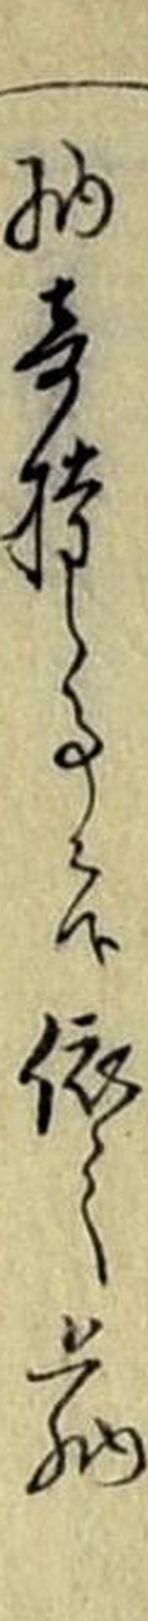納奇特之事に候依之上納
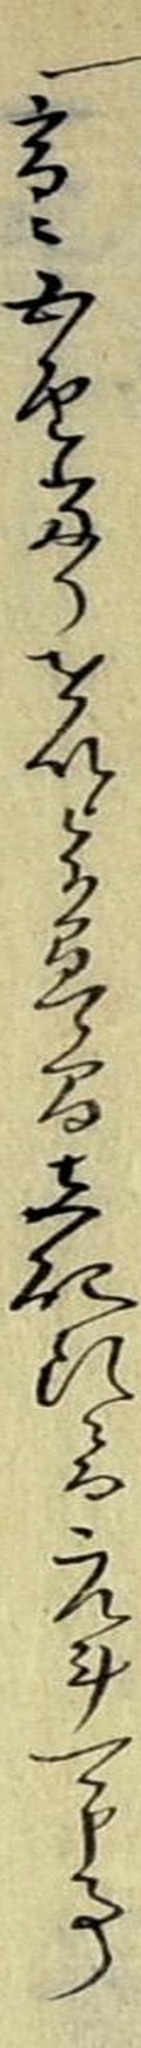高に五厘当りを以被下置候間支配頭に而取斗可申事
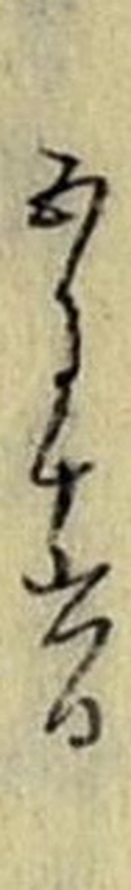五月十六日
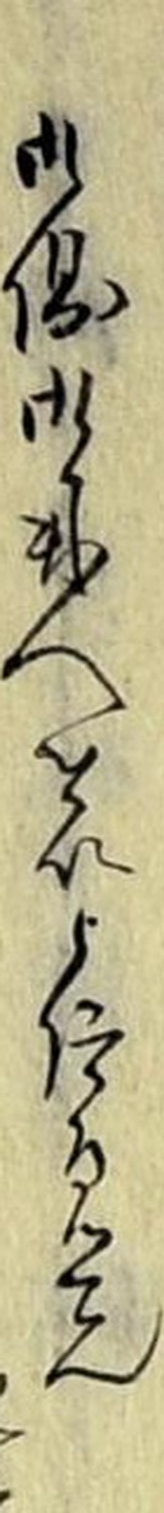御側御用人を以被仰付覚
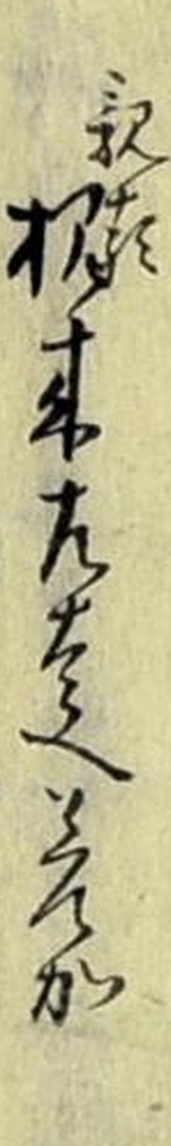根来左太夫差加

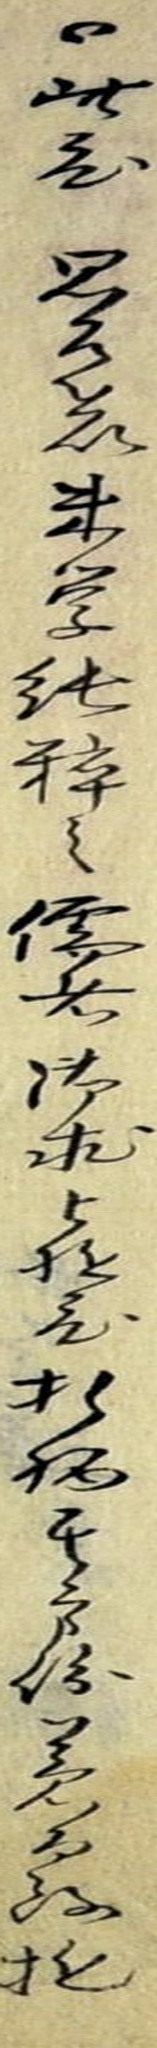○此度思召を以朱学純粋之儒者御求被遊度折柄其方儀兼而致遊
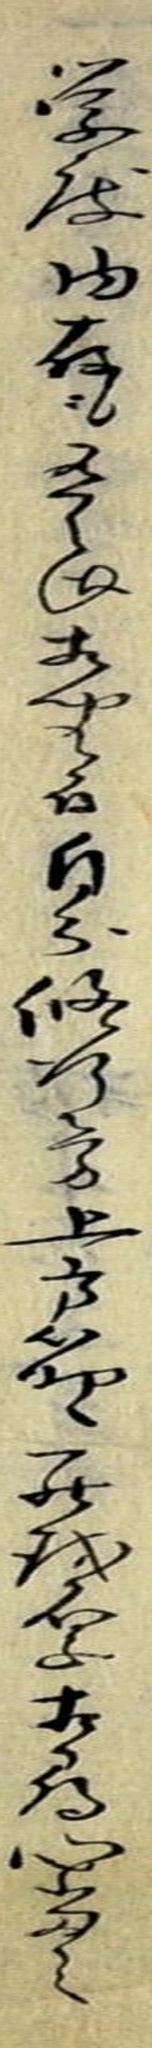学度由存も有之趣相聞候に付自分修行旁上方筋へ罷越厚相尋心当之
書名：命令之部 六
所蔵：福井県文書館 Fukui Prefectural Archives
